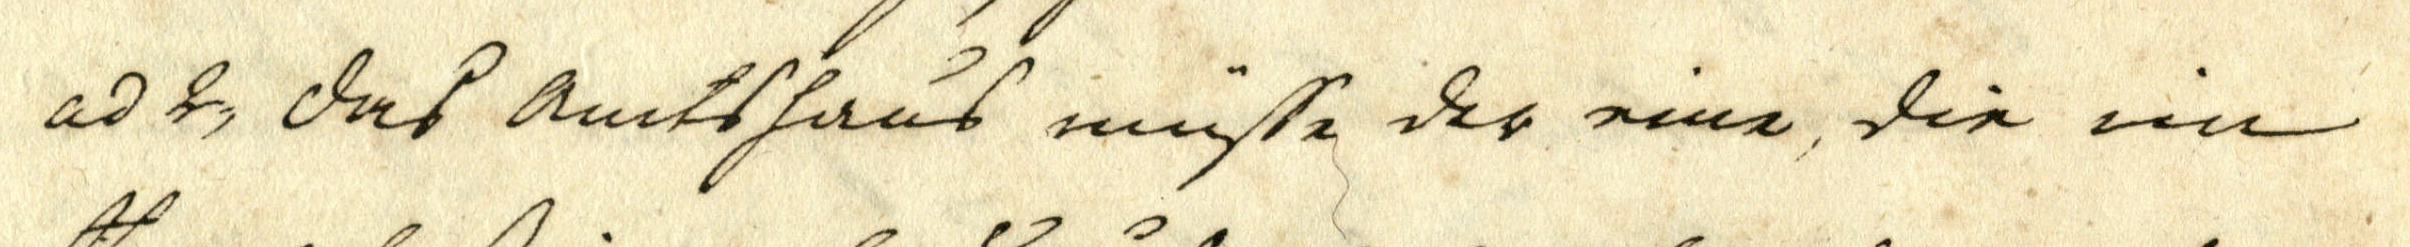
ad 2, Das Amtshaus müsse der eine, die im
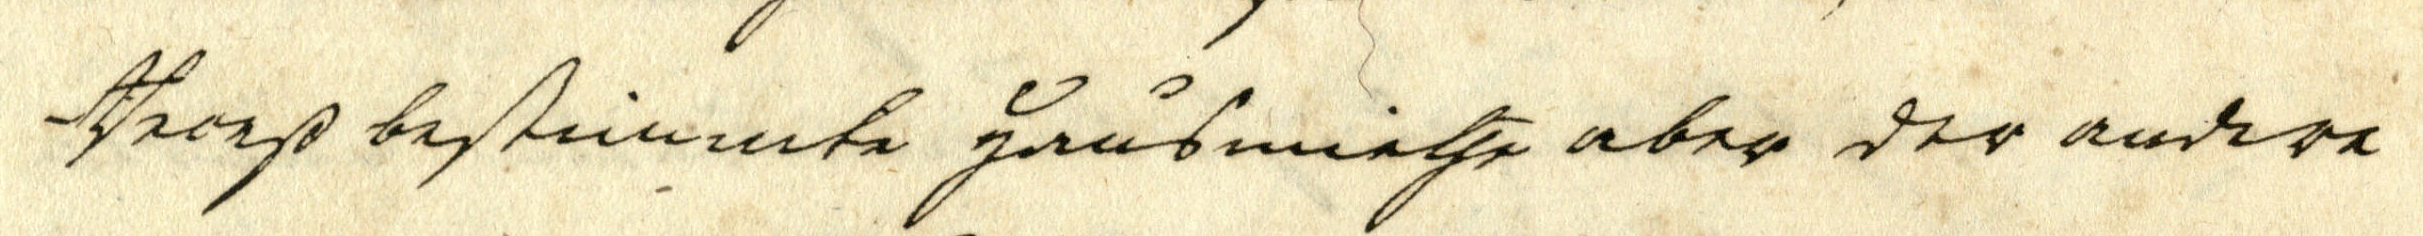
Receß bestimmte Hausmiethe aber der andere
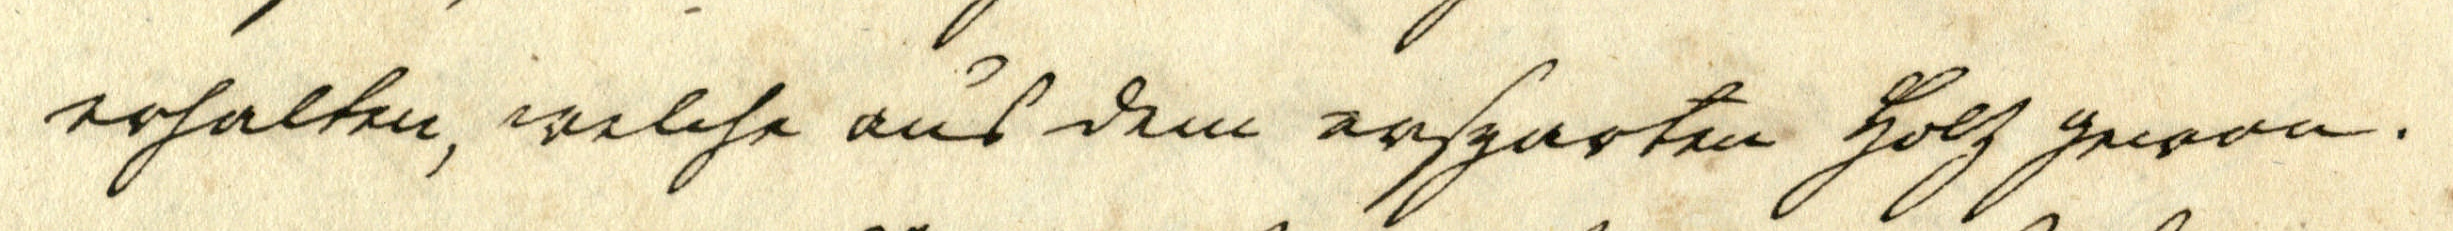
erhalten, welche aus dem ersparten Holz genom¬
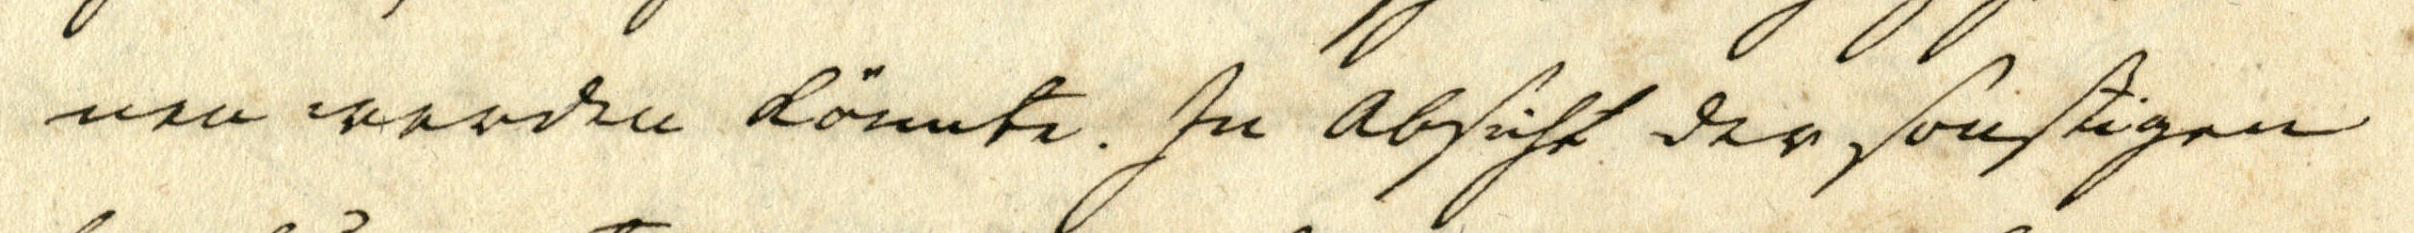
men werden könnte. In Absicht der sonstigen
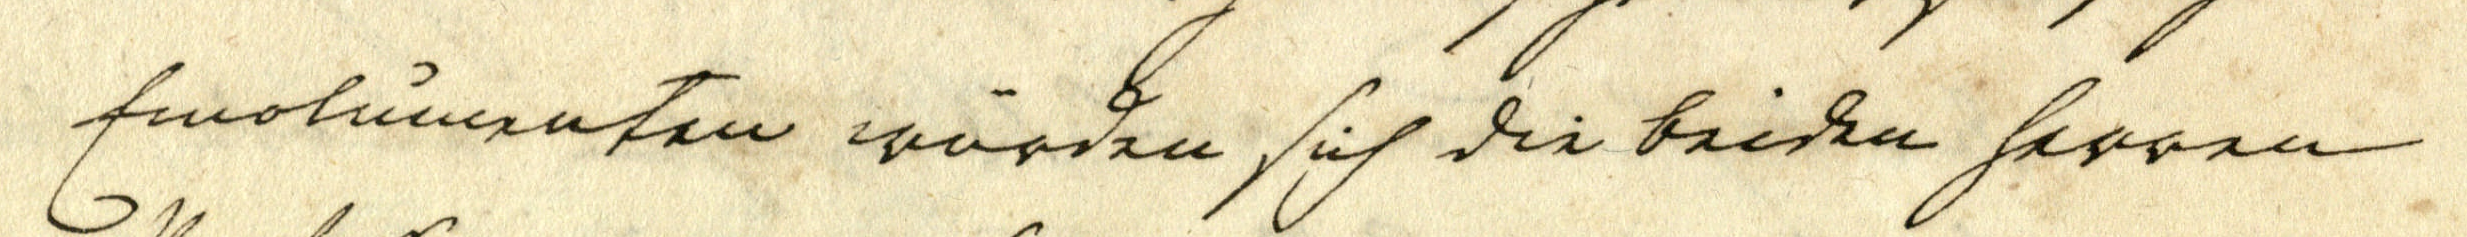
Emolumenten würden sich die beiden herren
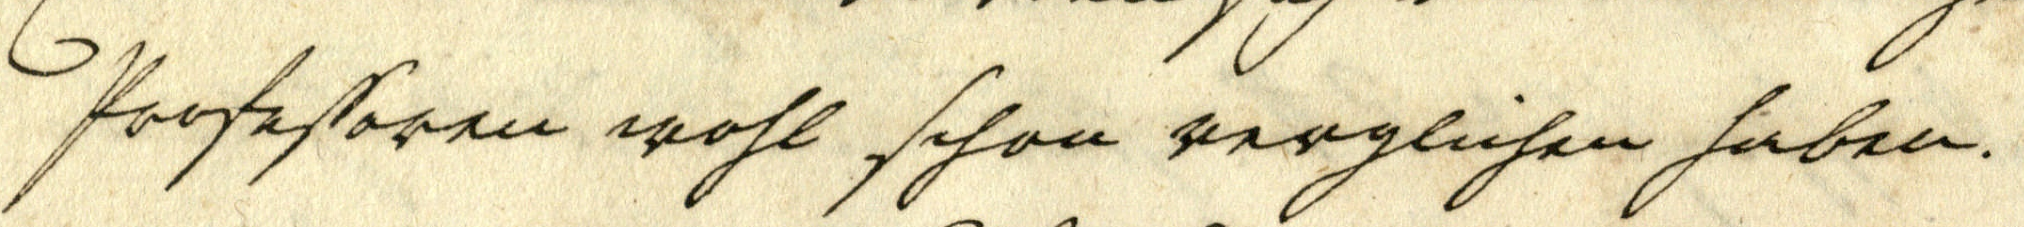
Professoren wohl schon verglichen haben.
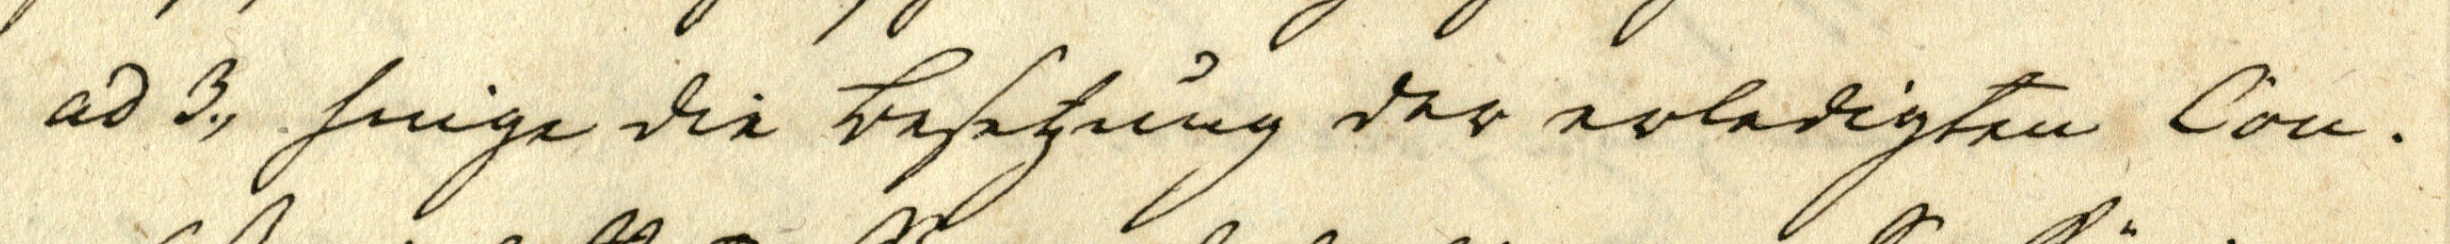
ad 3., hinge die Besetzung der erledigten Con¬
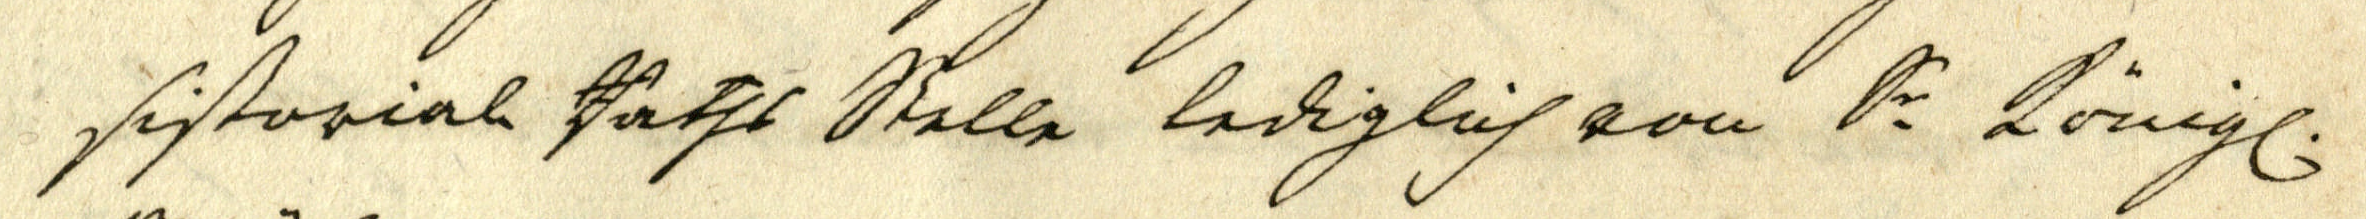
sistorial Raths Stelle lediglich von Sr. Königl.
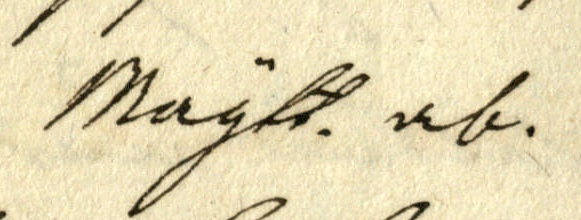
Maÿtt. ab.
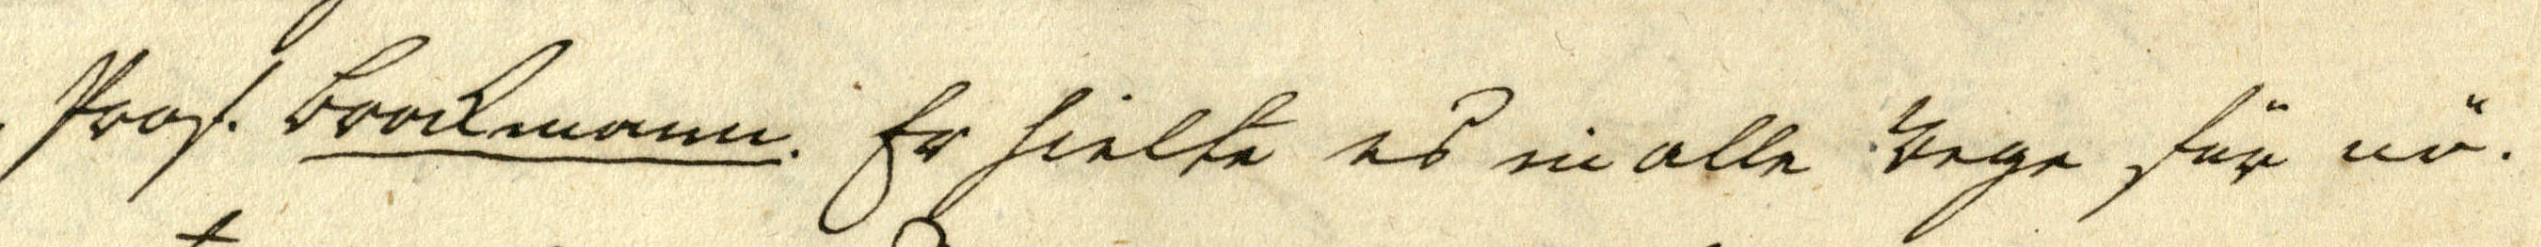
Prof. Brockmann. Er hielte es in alle Wege für nö¬
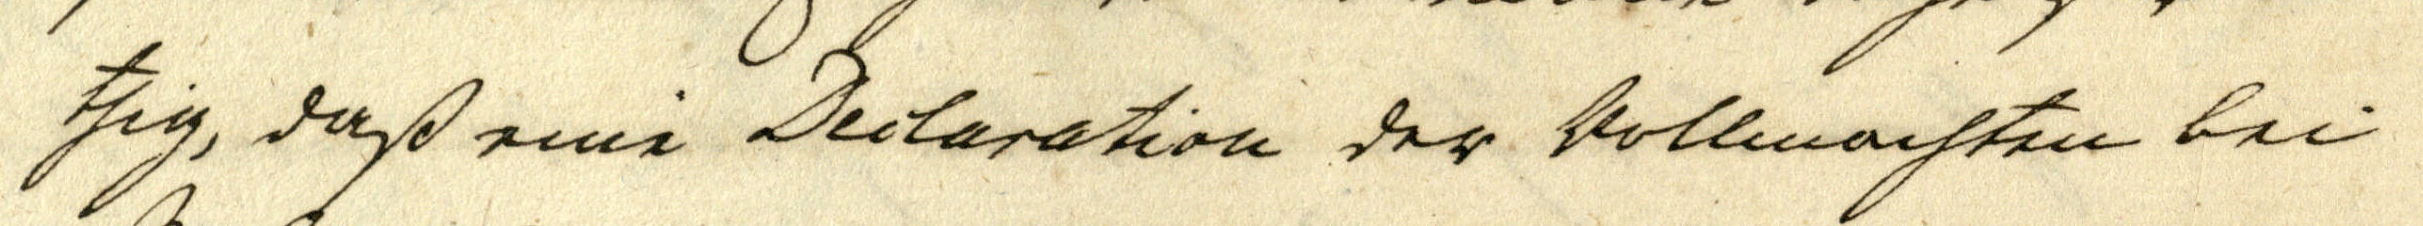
thig, daß eine Declaration der Vollmachten bei
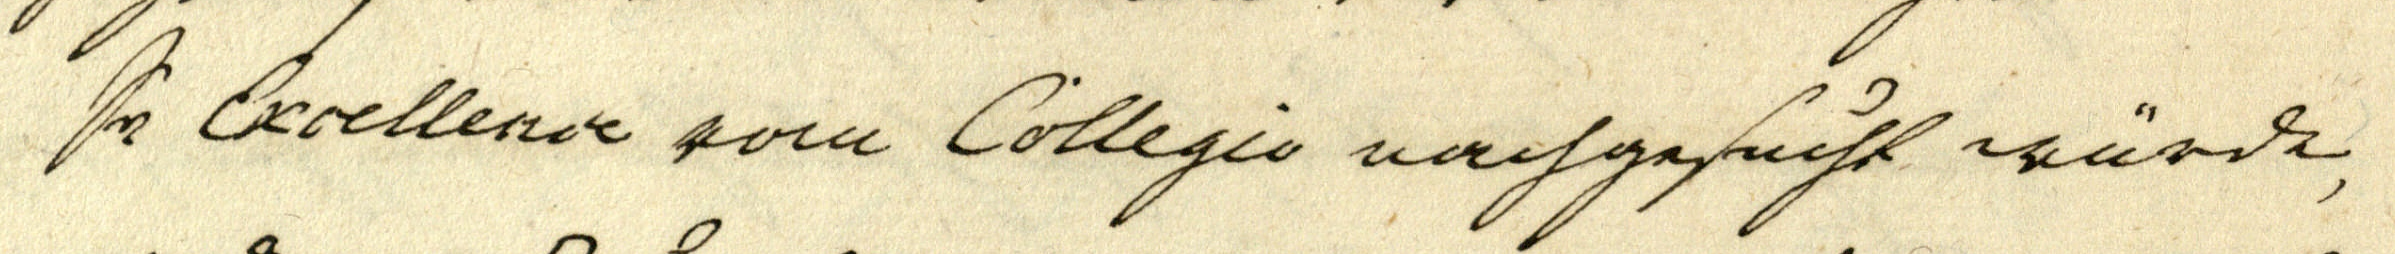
Sr. Excellence vom Collegio nachgesucht würde,
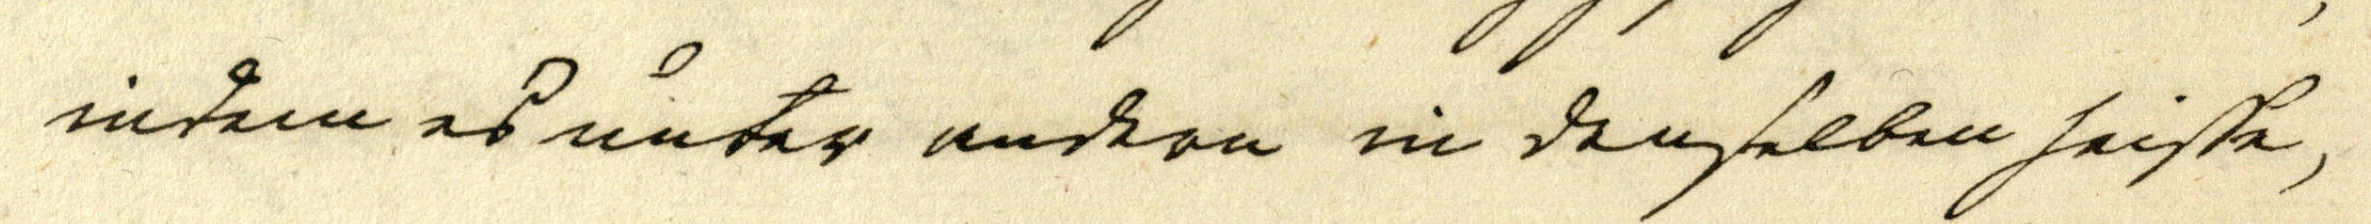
indem es unter andern in denselben heisse,
